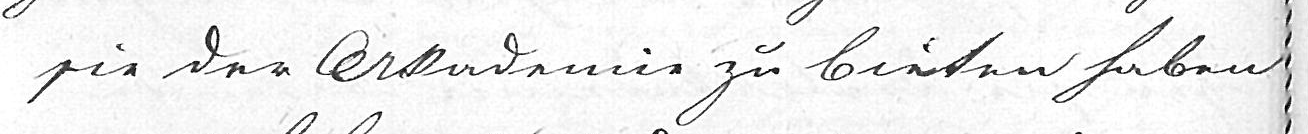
sie der Akademie zu bieten haben
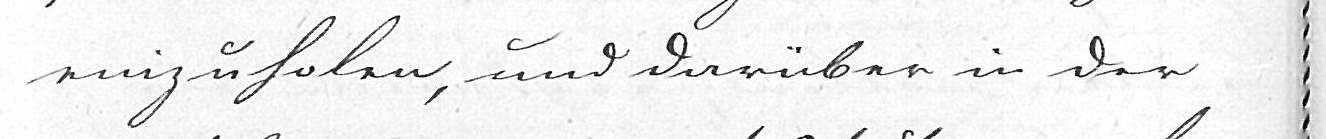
einzuholen, und darüber in der
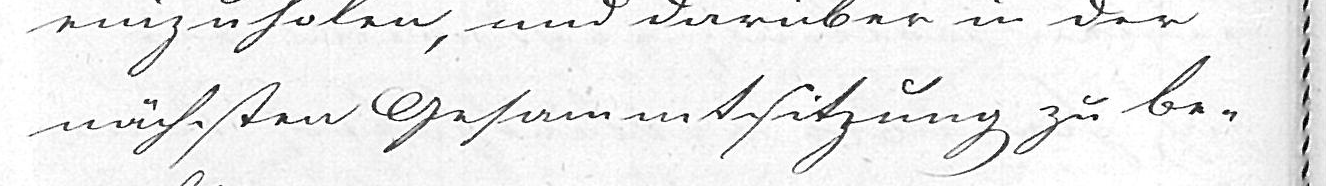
nächsten Gesammtsitzung zu be-
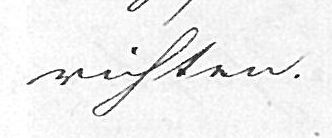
richten.
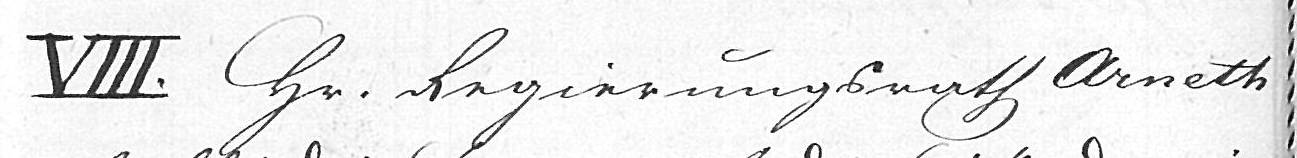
VIII. Hr. Regierungsrath Arneth
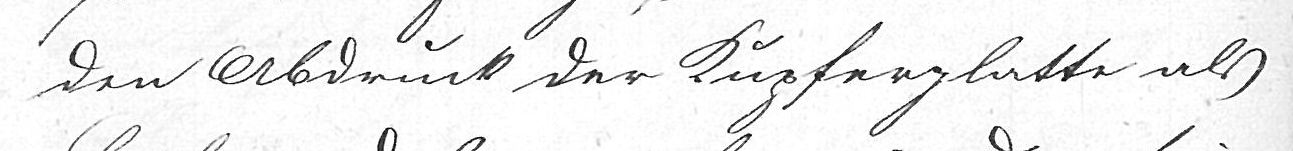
den Abdruck der Kupferplate als
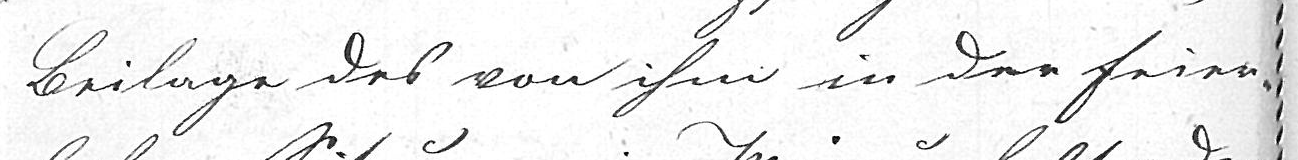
Beilage des von ihm in der feier-
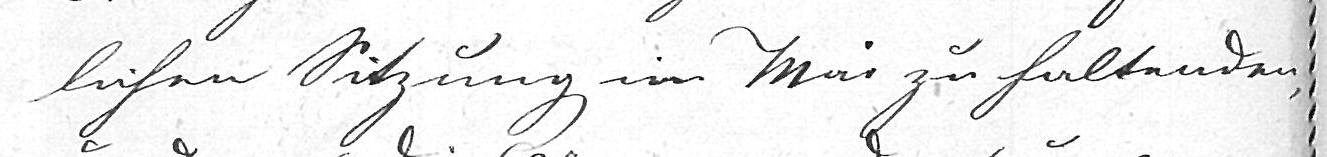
lichen Sitzungen im Mai zu haltenden
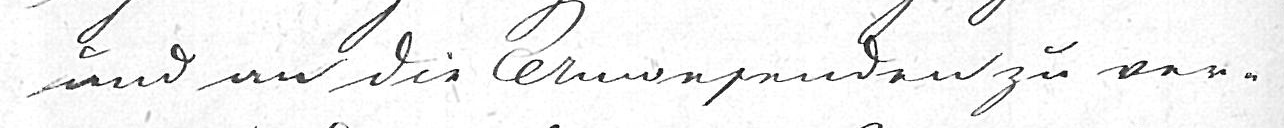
und an die Anwesenden zu ver-
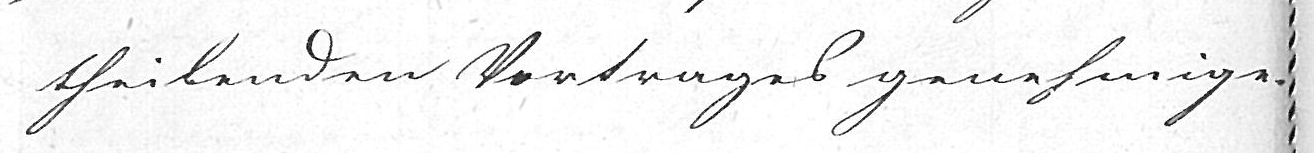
theilenden Vortrages genehmige.
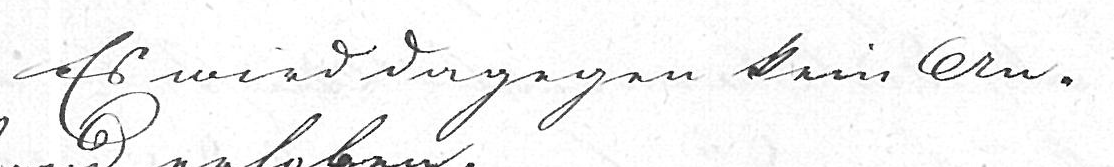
Es wird dagegen keine An-
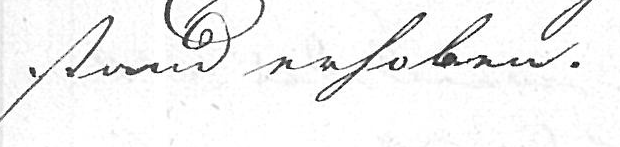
stand erhoben.
